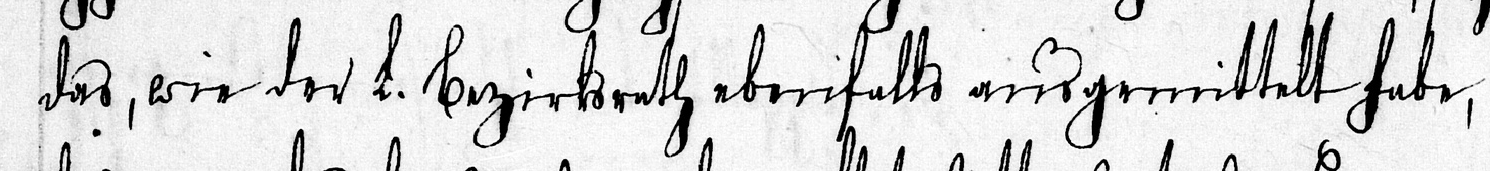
das, wie der L. Bezirksrath ebenfalls ausgemittelt habe,
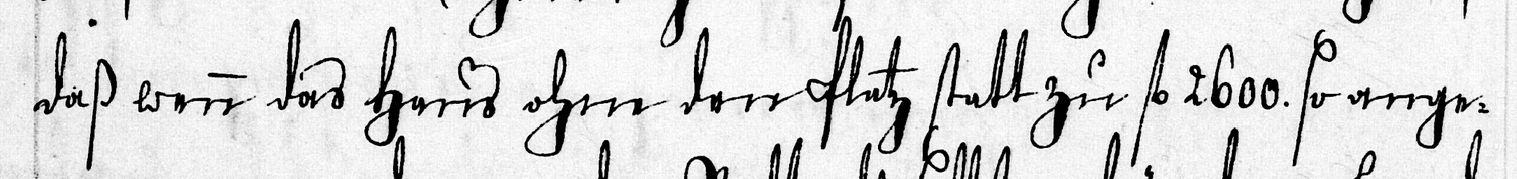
daß wenn das Haus ohne den Platz statt zu fl 2600. so ange¬
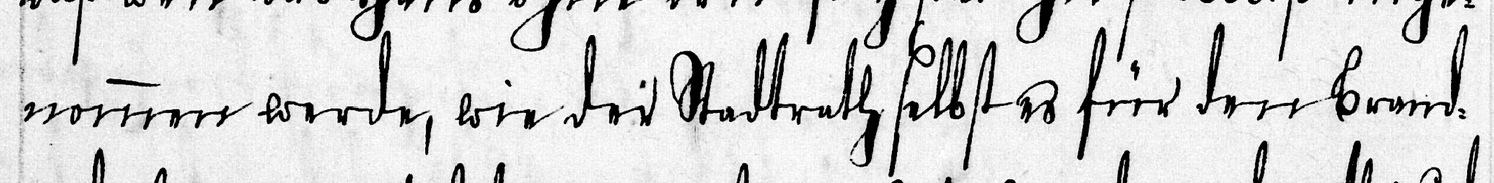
nommen werde, wie der Stadtrath selbst es für den Brand¬
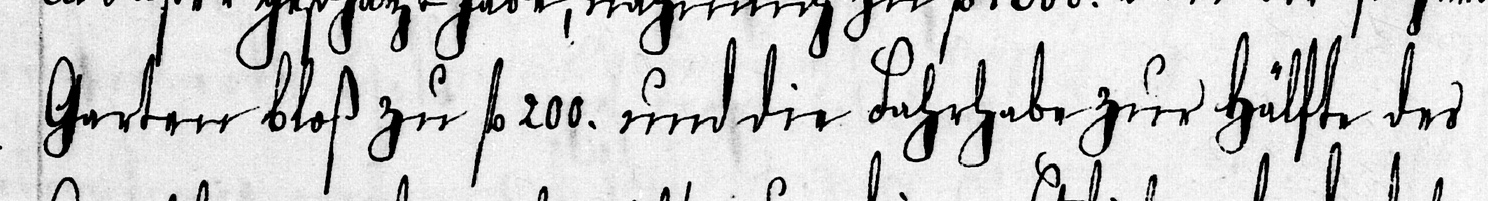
Garten bloß zu fl 200. und die Fahrhabe zur Hälfte des
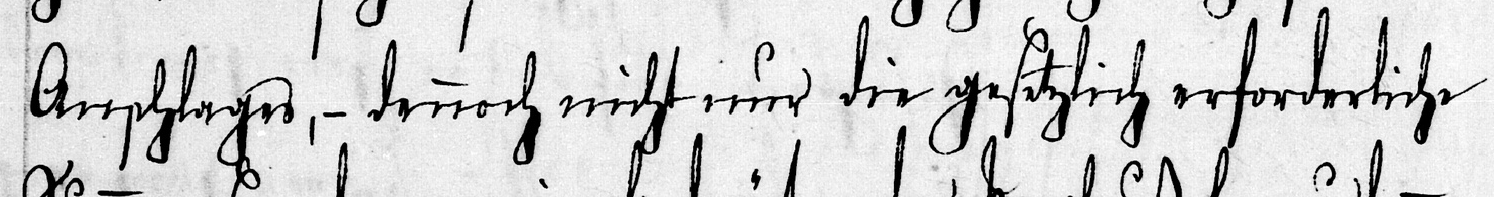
Anschlages, – dennoch nicht nur die gesetzlich erforderliche
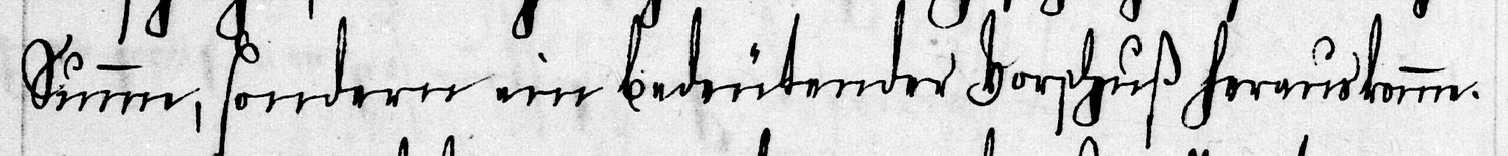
Summe, sondern ein bedeutender Vorschuß herauskomme.
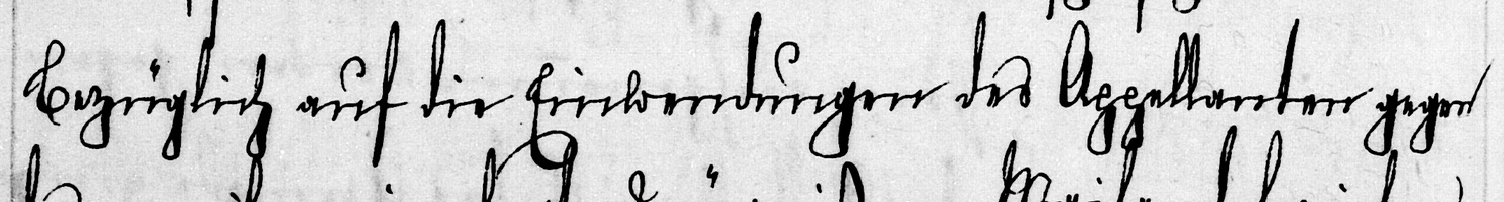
Bezüglich auf die Einwendungen des Appellanten gegen
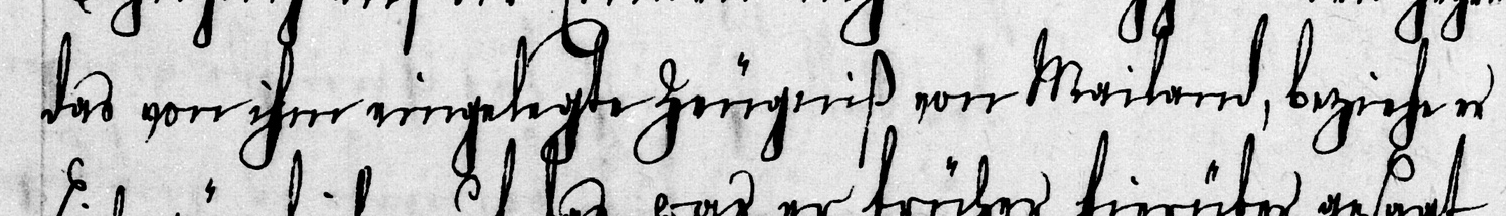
das von ihm eingelegte Zeugniß von Mailand, beziehe er
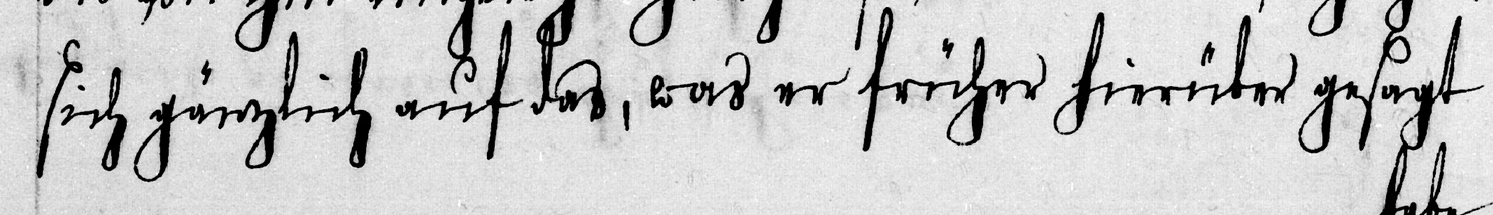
sich gänzlich auf das, was er früher hierüber gesagt
